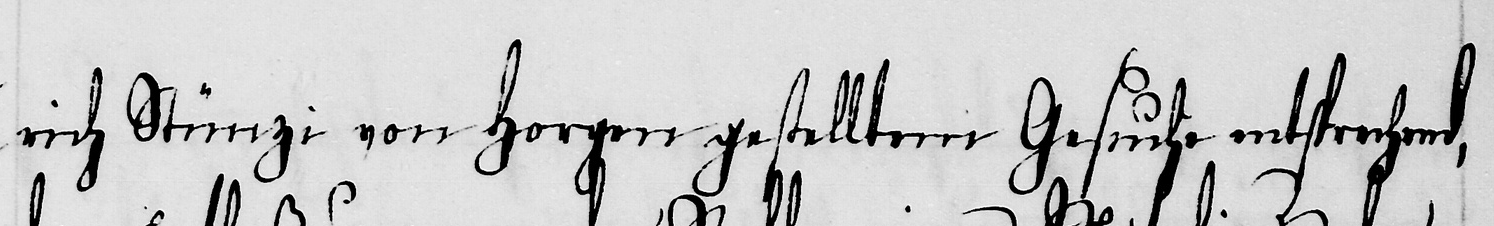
rich Stünzi von Horgen gestelltem Gesuche entsprechen¬
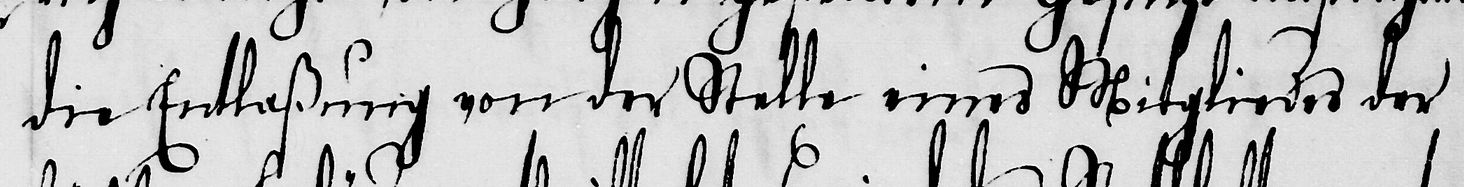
die Entlaßung von der Stelle eines Mitgliedes der
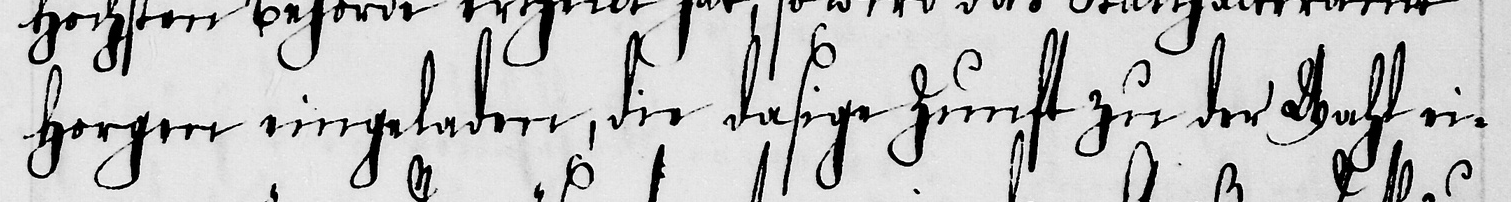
Horgen eingeladen, die dasige Zunft zu der Wahl ei¬
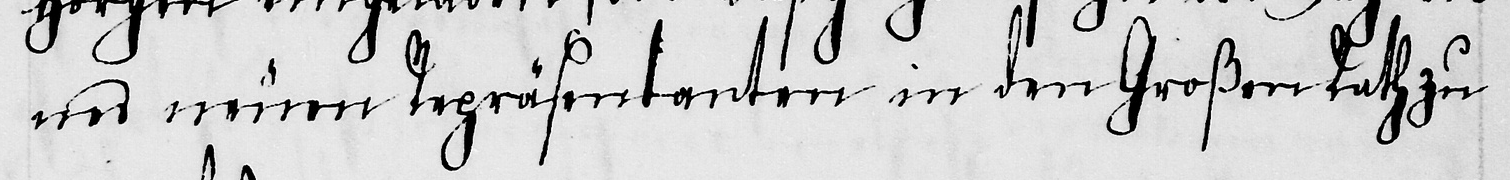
nes neuen Repräsentanten in den Großen Rath zu
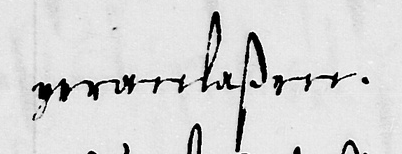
veranlaßen.
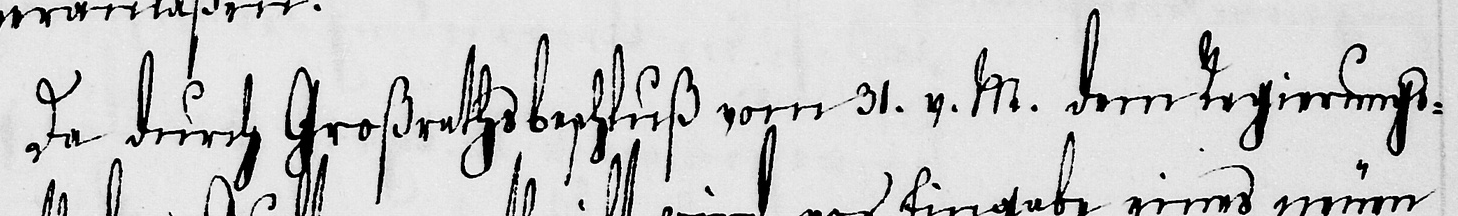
Da durch Großrathsbeschluß vom 31. v. M. dem Regierungs¬
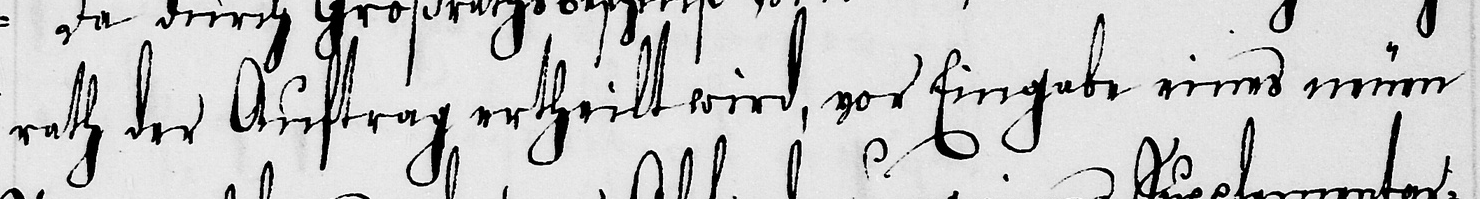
rath der Auftrag erheilt wird, vor Eingabe eines neuen
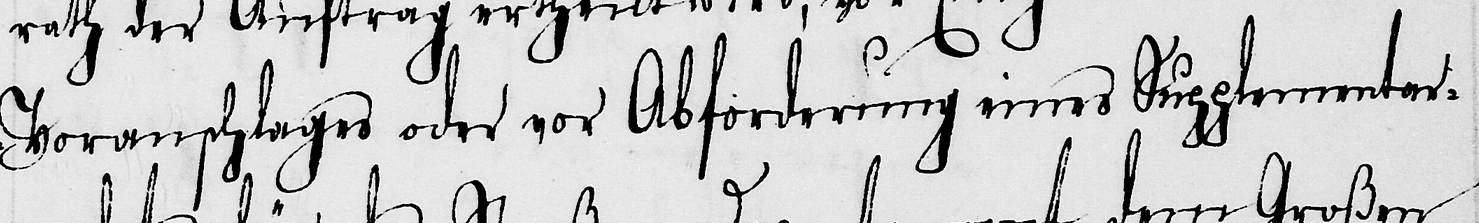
Voranschlages oder vor Abforderung eines Supplementar¬
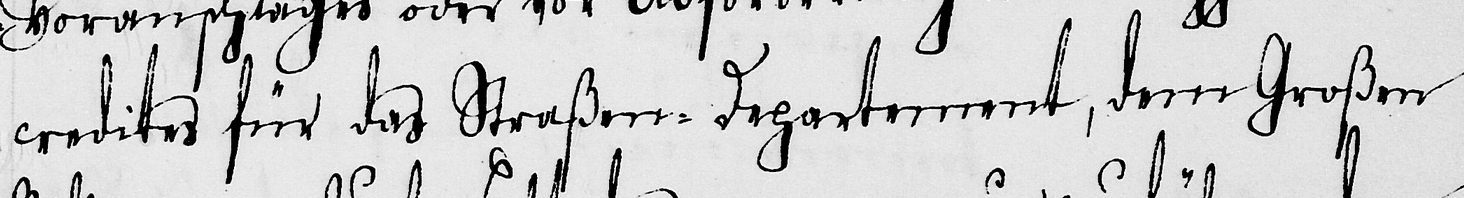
credites für das Straßen-Departement, dem Großen
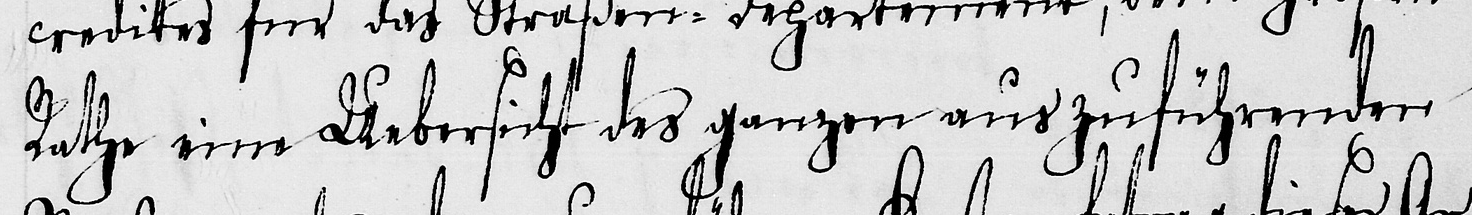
Rathe eine Uebersicht des ganzen auszuführenden
